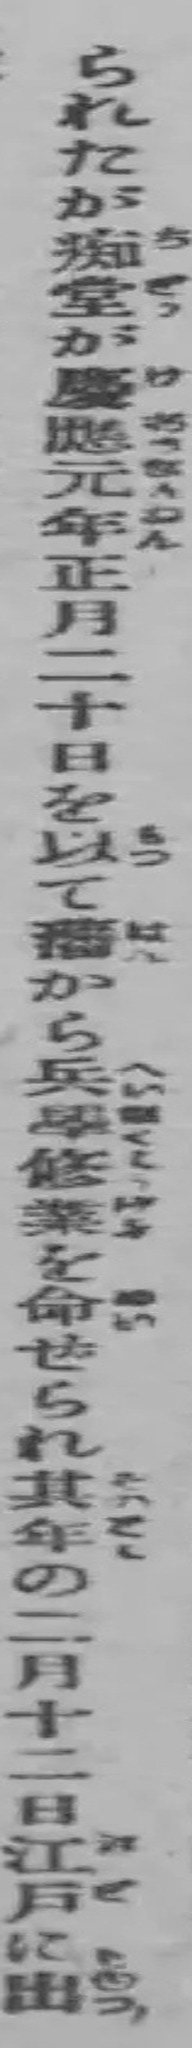られたが痴堂が慶応元年正月二十日を以て藩から兵学修行を命ぜられ其年の二月十二日江戸に出
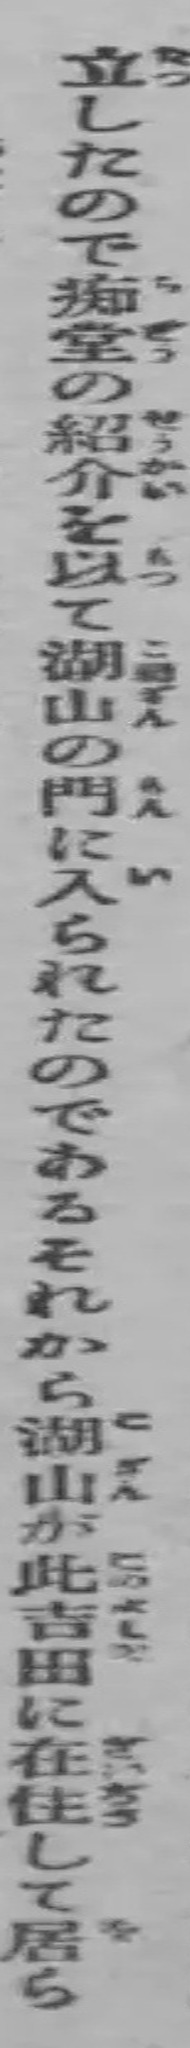立したので痴堂の紹介を以て湖山の門に入られたのであるそれから湖山が此吉田に在住して居ら
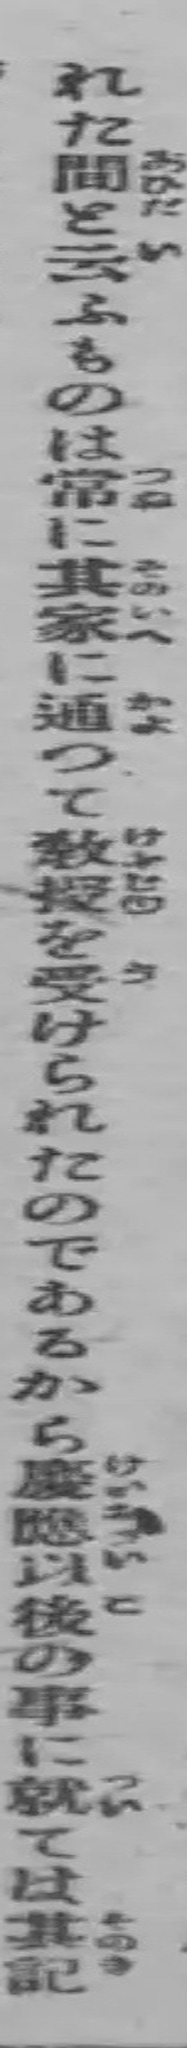れた間と云ふものは常に其家に通つて教授を受けられたのであるから慶応以後の事に就ては其記
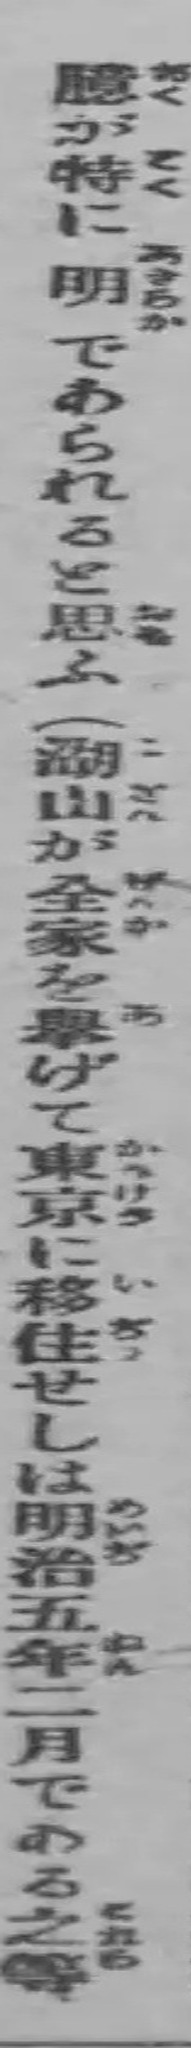臆が特に明であられると思ふ(湖山が全家を挙げて東京に移住せしは明治五年二月である之等
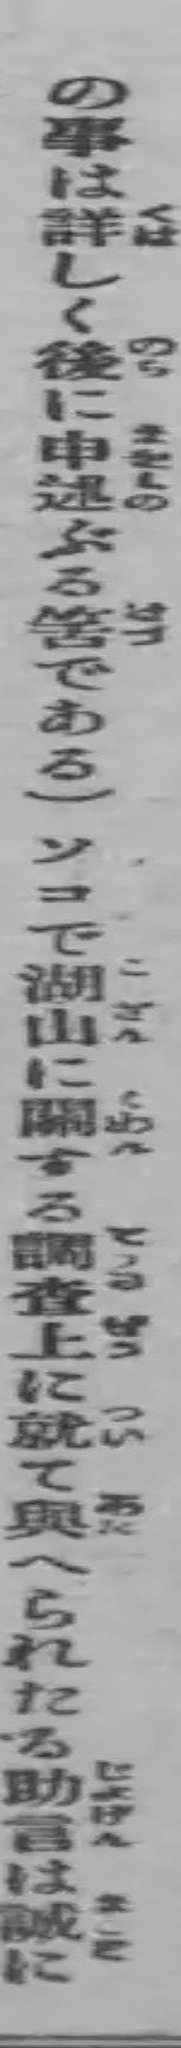の事は詳しく後に申述ぶる筈である)ソコで湖山に関する調査上に就て与へられたる助言は誠に
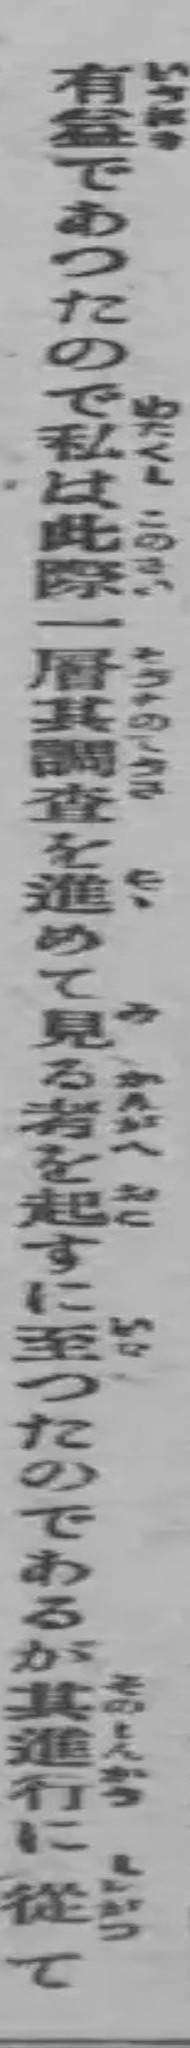有益であつたので私は此際一層其調査を進めて見る考を起すに至つたのであるが其進行に従て
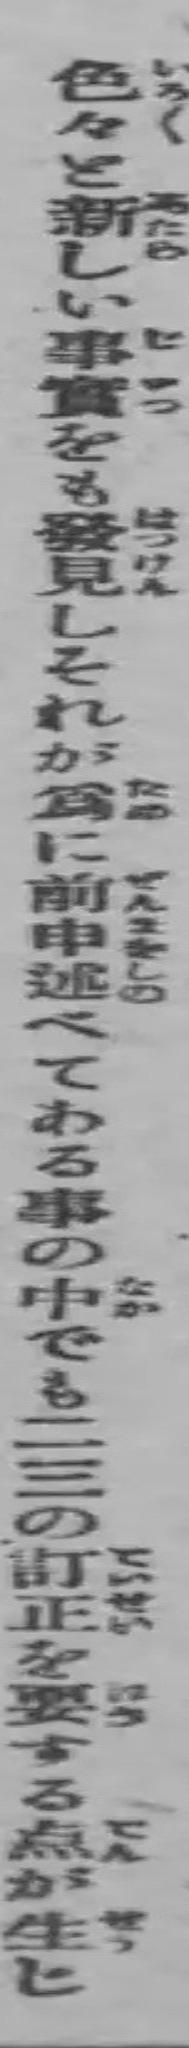色々と新しい事実をも発見しそれが為に前申述べてある事の中でも二三の訂正を要する点が生じ
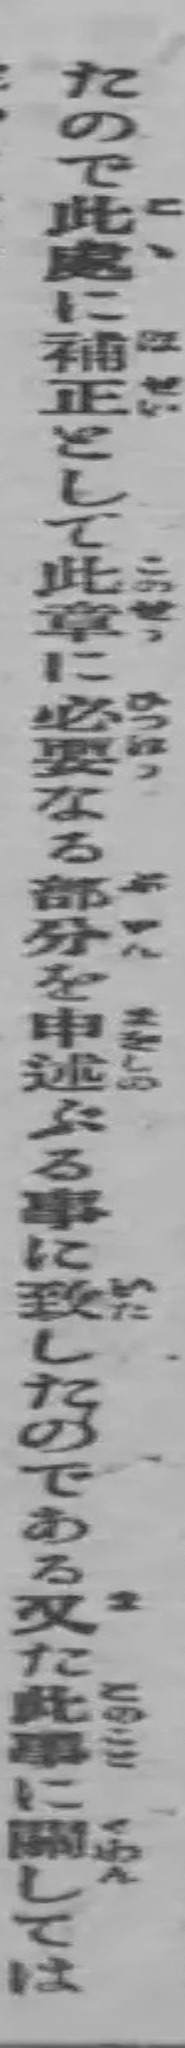たので此処に補正として此章に必要なる部分を申述ぶる事に致したのである又た此事に関しては
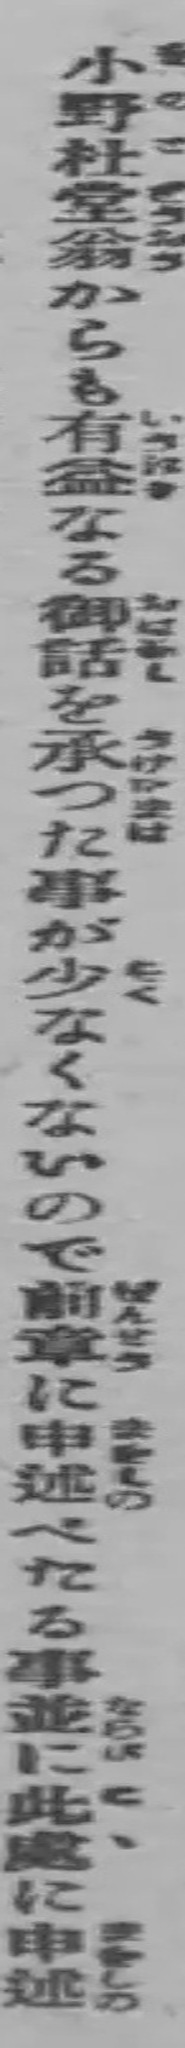小野杜堂翁からも有益なる御話を承つた事が少なくないので前章に申述べたる事並に此処に申述
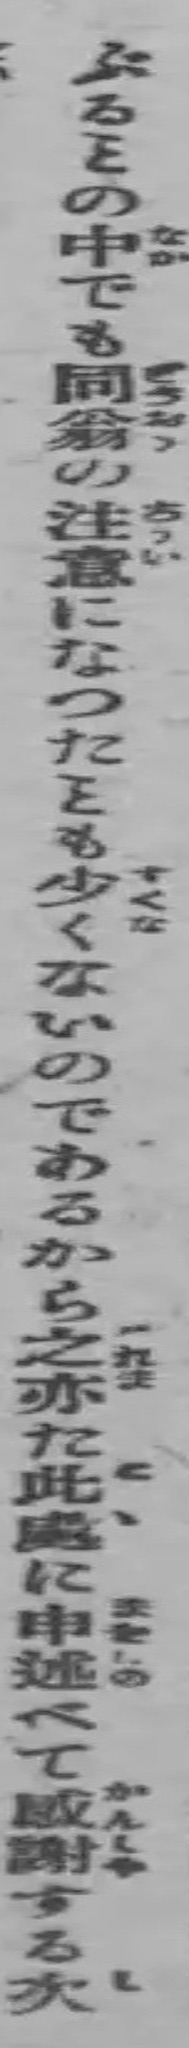ぶることの中でも同翁の注意になつたことも少くないのであるから之亦た此処に申述べて感謝する次
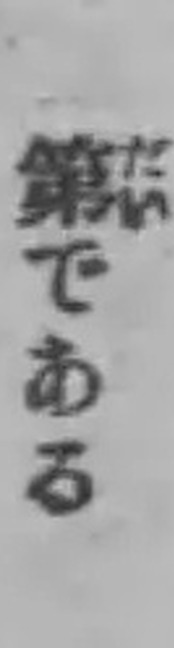第である
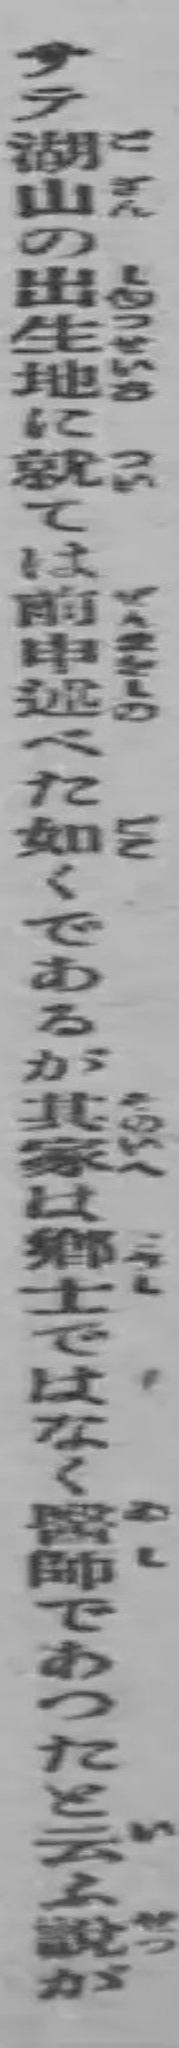サテ湖山の出生地に就ては前申述べた如くであるが其家は郷士ではなく医師であつたと云ふ説が
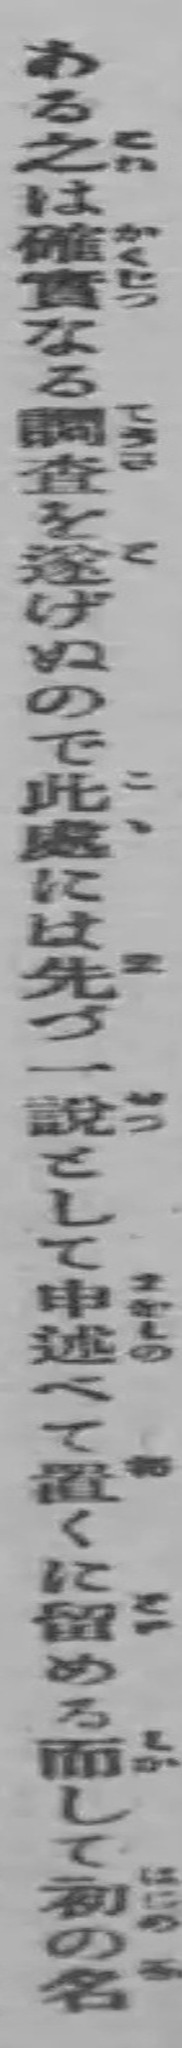ある之は確実なる調査を遂げぬので此処には先づ一説として申述べて置くに留める而して初の名
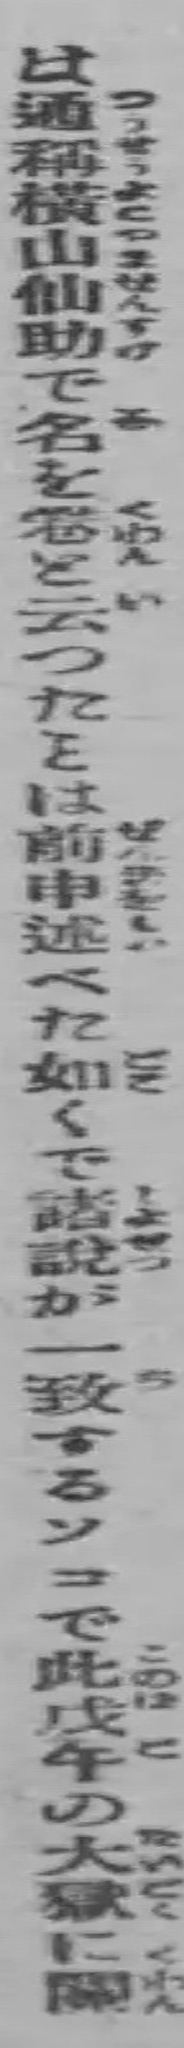は通称横山仙助で名を巻と云つたことは前申述べた如くで諸説が一致するソコで此戊午の大獄に関
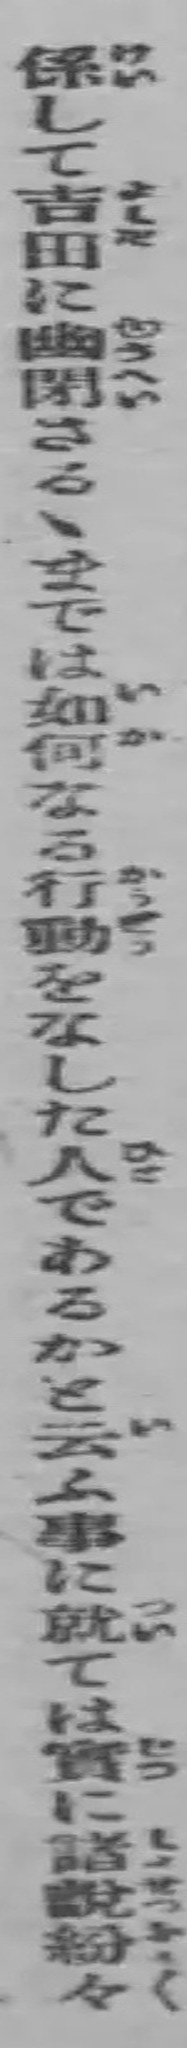係して吉田に幽閉さるヽまでは如何なる行動をなした人であるかと云ふ事に就ては実に諸説紛々
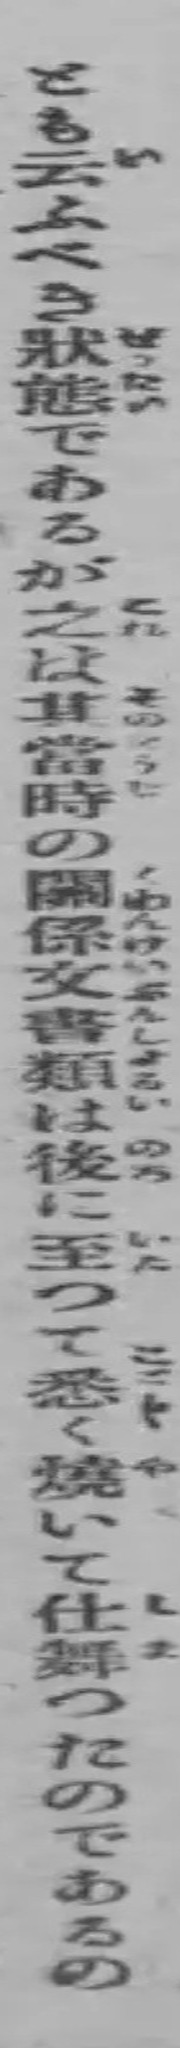とも云ふべき状態であるが之は其当時の関係文書類は後に至つて悉く焼いて仕舞つたのであるの
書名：豊橋市史談
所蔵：国立国会図書館 National Diet Library, JAPAN
